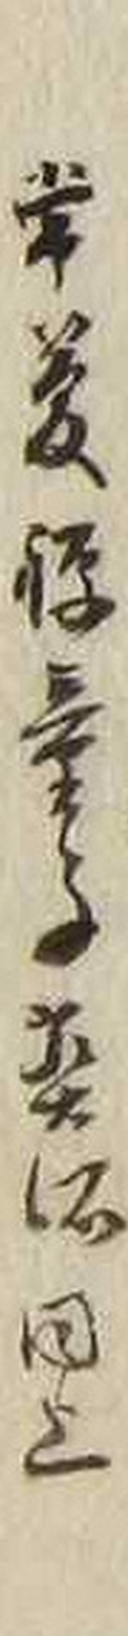常夢禅童子葬所同上

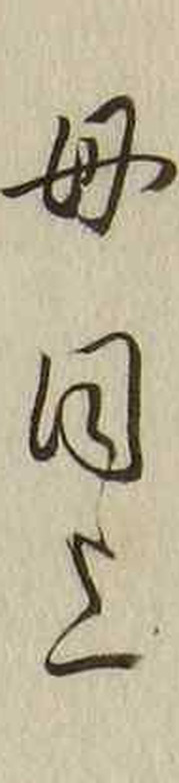母同上
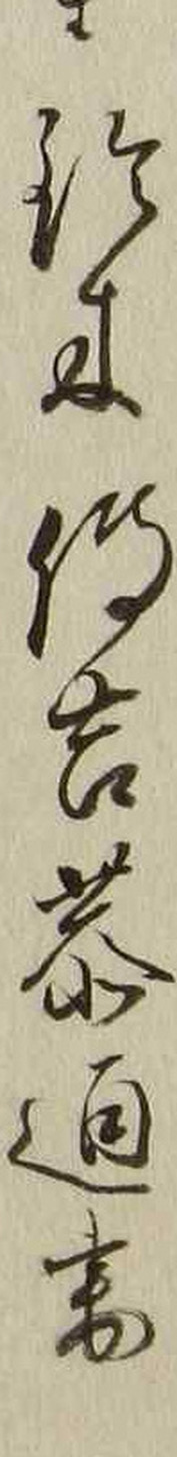鈴木伝吉恭通妻
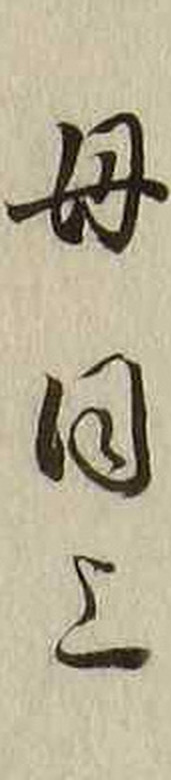母同上
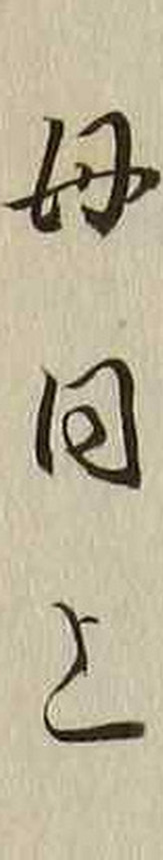母同上
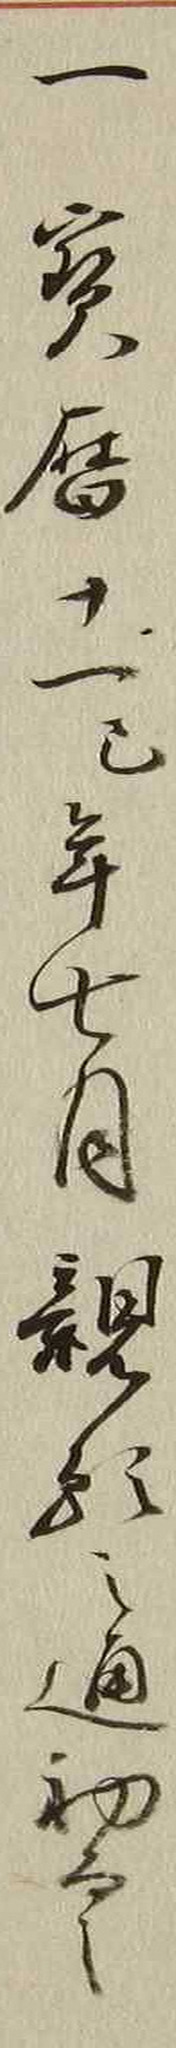一宝暦十一巳年七月親願之通初而之
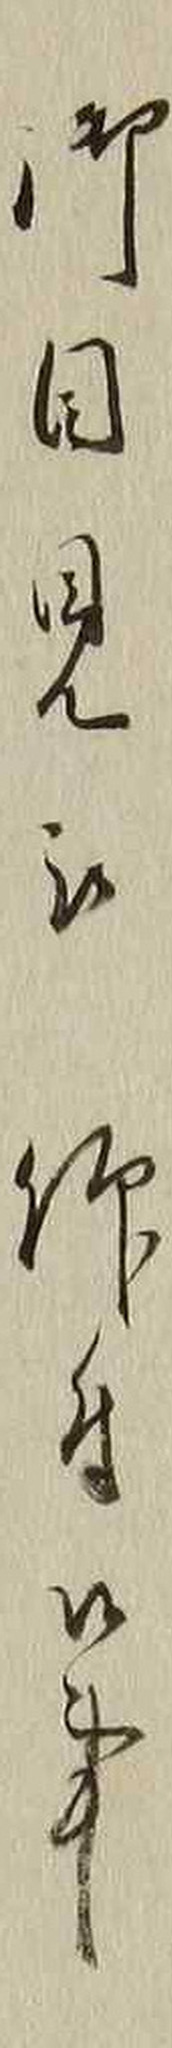御目見被仰付候事
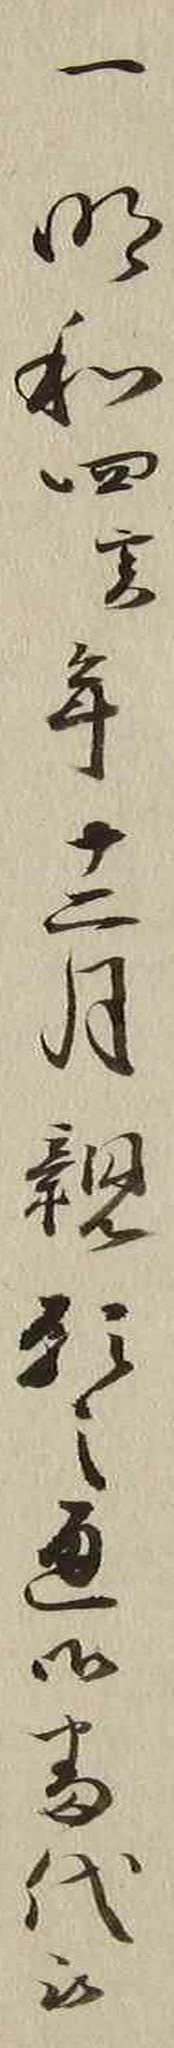一明和四亥年十二月親願之通御番代被
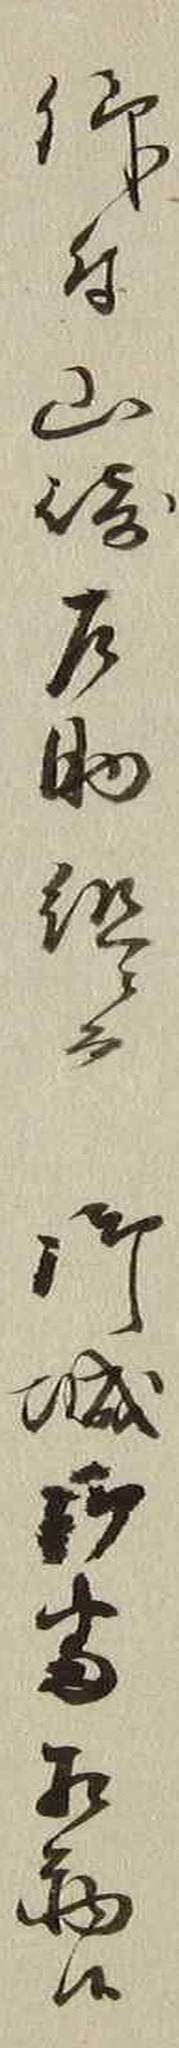仰付山崎左助組ニ而御城御番相勤候
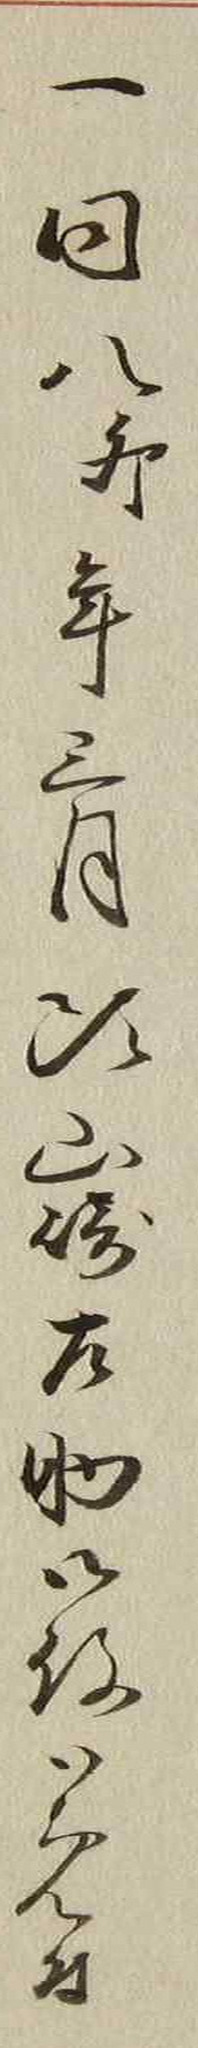一同八卯年三月頭山崎左助御役御免付
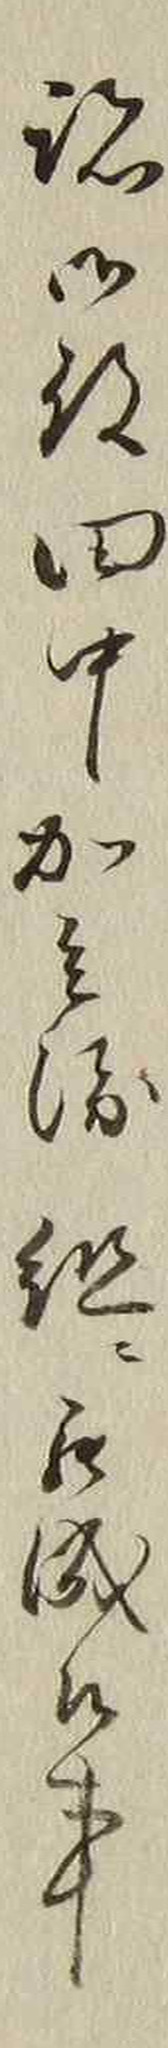跡御役田中加兵衛組ニ罷成候事
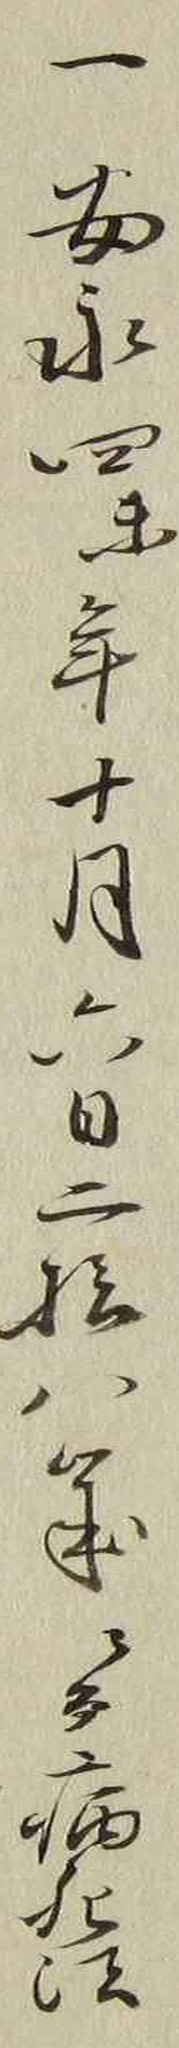一安永四未年十月六日二拾八歳ニ而病死法
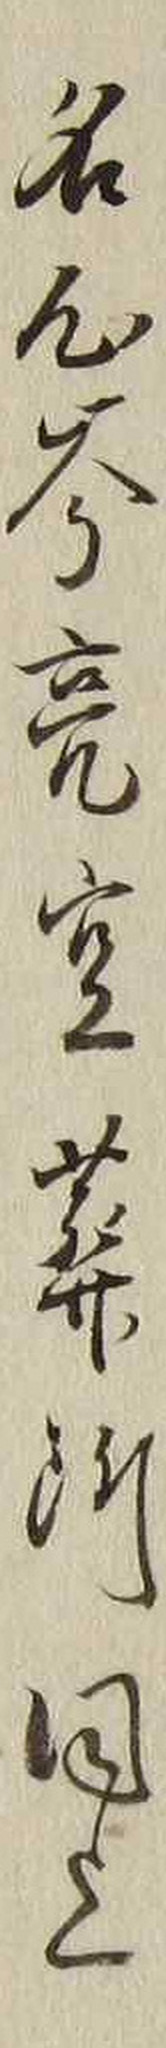名心岑亮空葬所同上
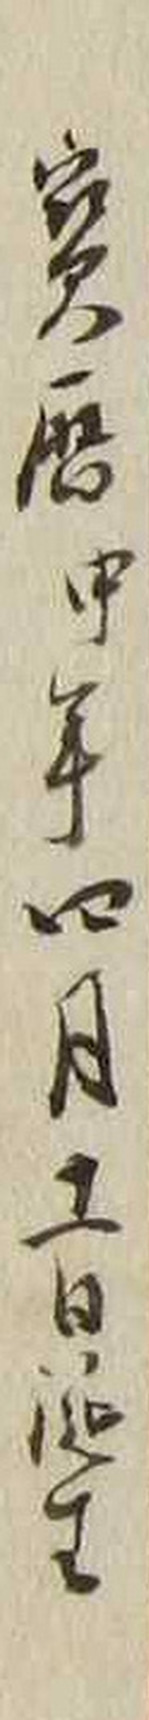宝暦申年四月十一日誕生
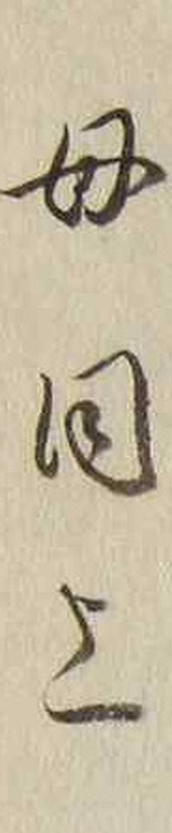母同上
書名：諸士系譜　巻之25　い之部25
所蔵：会津若松市立会津図書館
